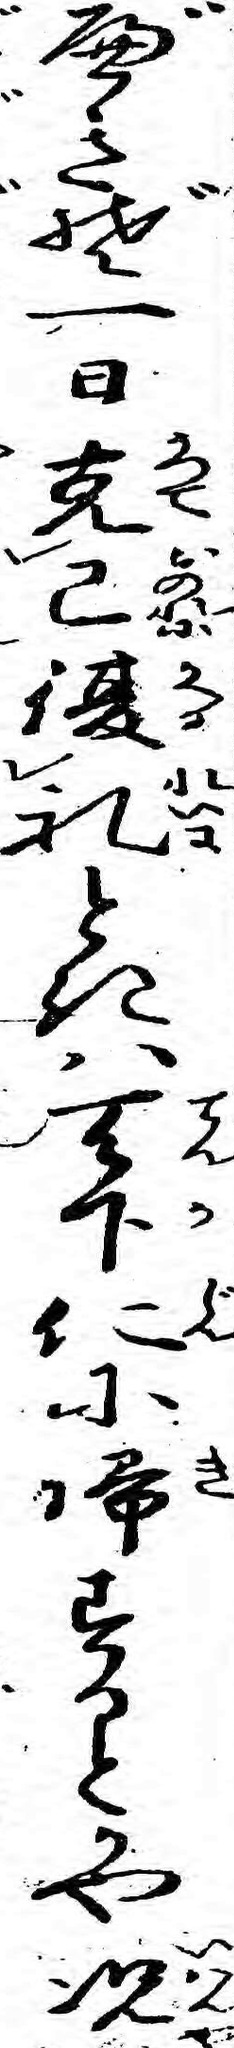へきぞ一日克已復礼ときは天下仁に帰するとかや況
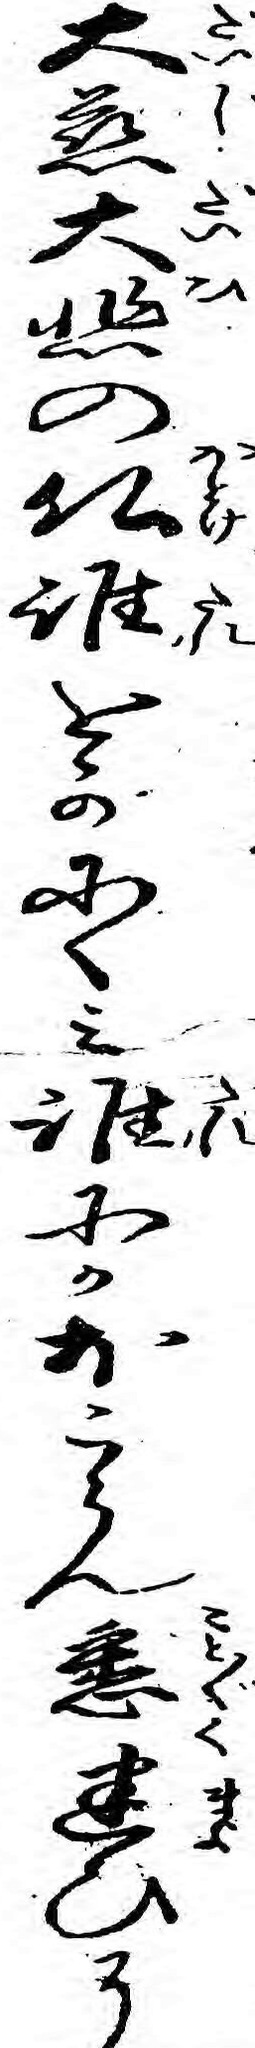大慈大悲の仏誰をかにくみ誰にかほこらん悉迷ひに
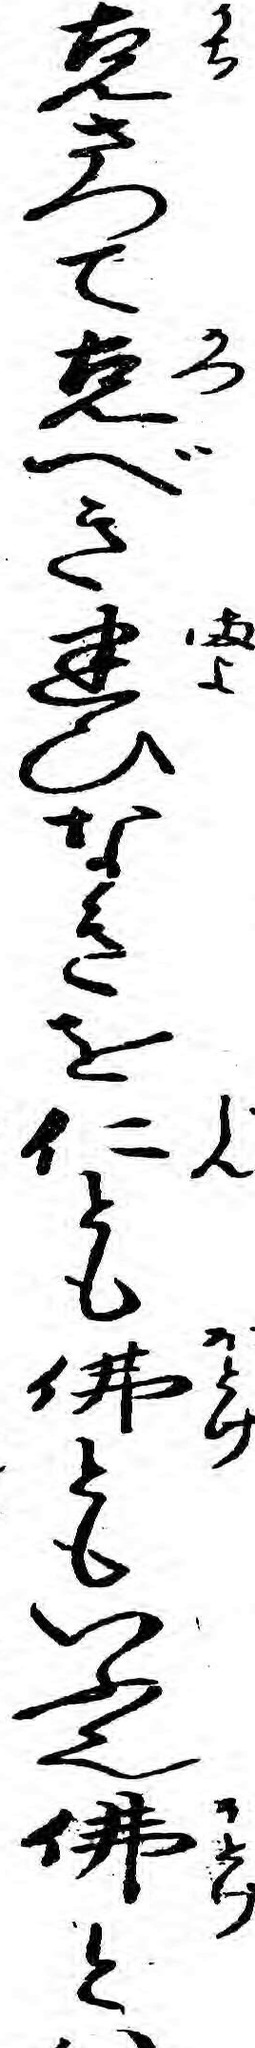克さつて克べき迷ひなきを仁とも仏ともいふ也仏とは
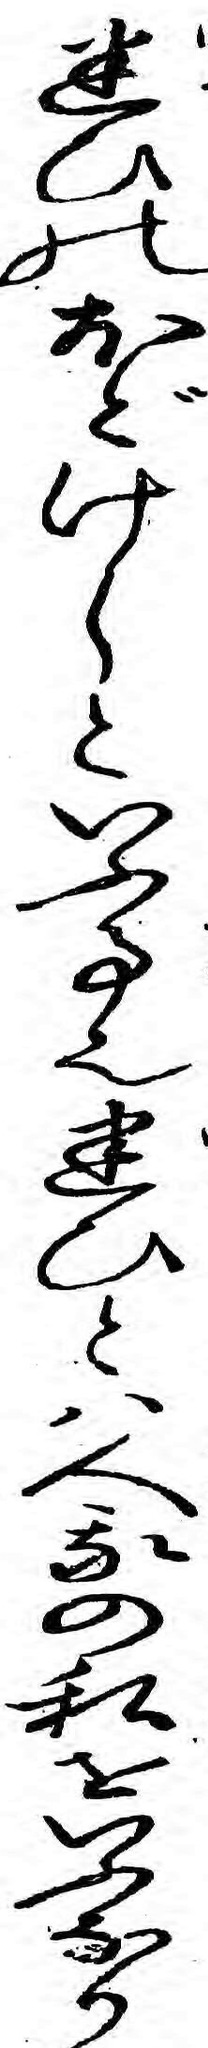迷ひのほどけしといふ事也迷ひとは人我の私をいふなり
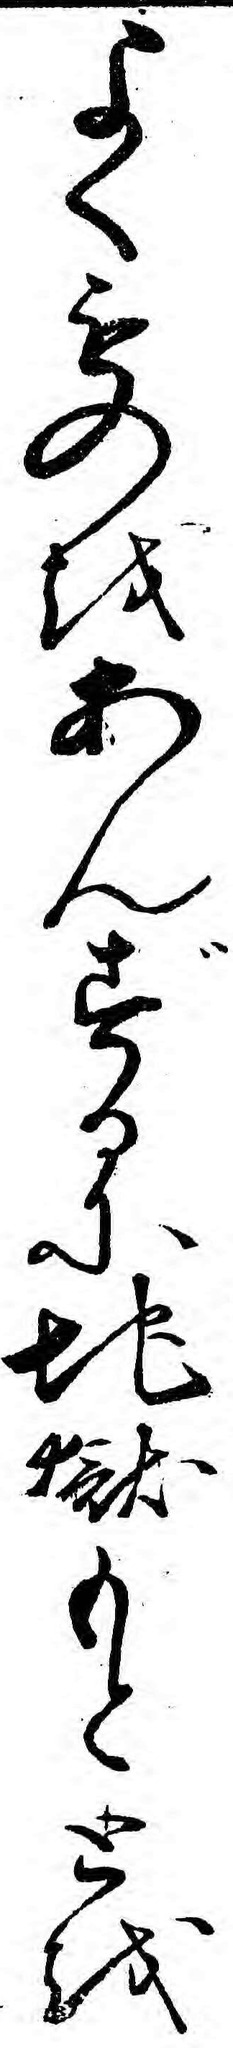よくものをあんずるに地獄もととを
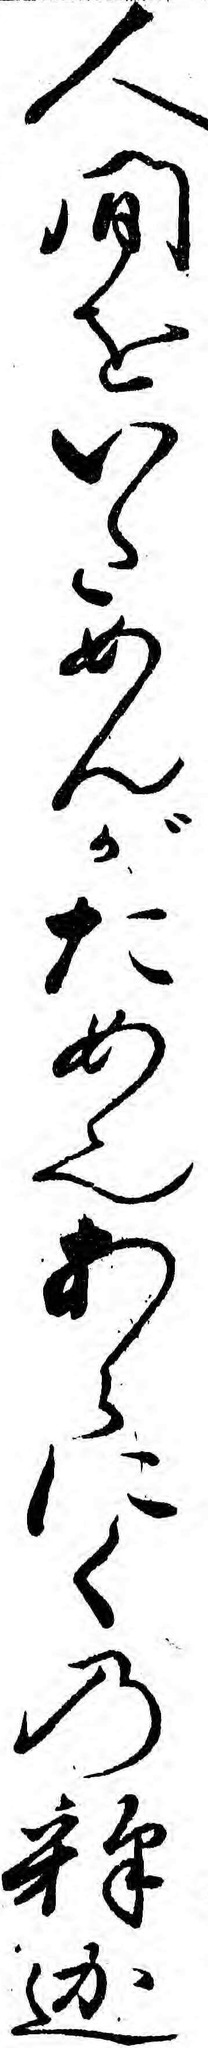人間をいためんがため也あらにくの釈迦
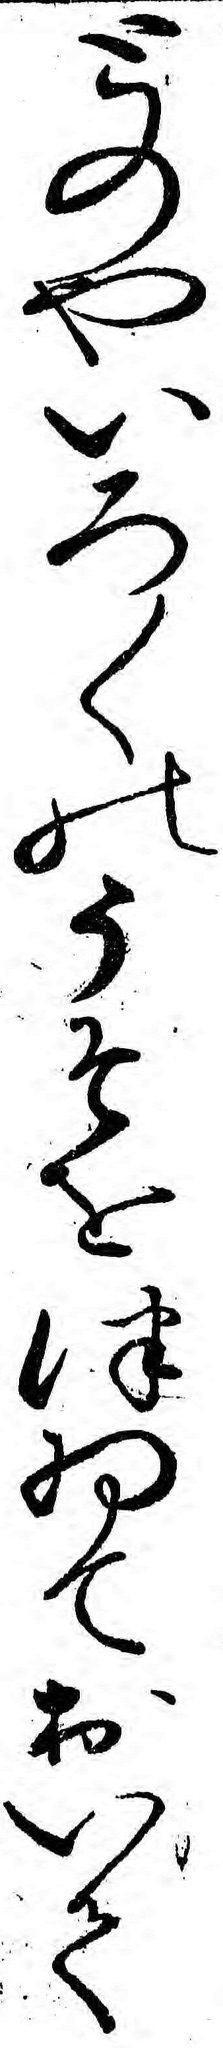どのやいろ〳〵のうそをつゐておいて

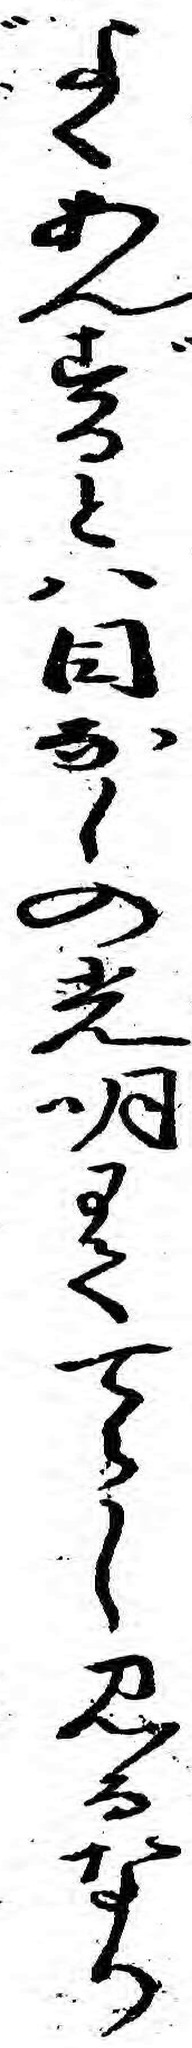よくあんずるとは目なしの光明にてらし見るなり
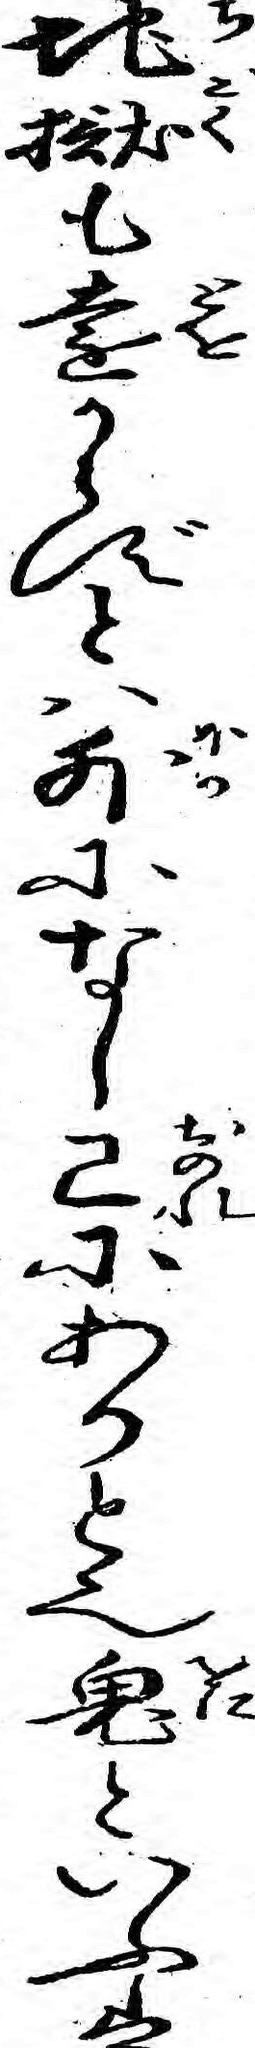地獄も遠からずとは外になし己にありと也鬼といふは
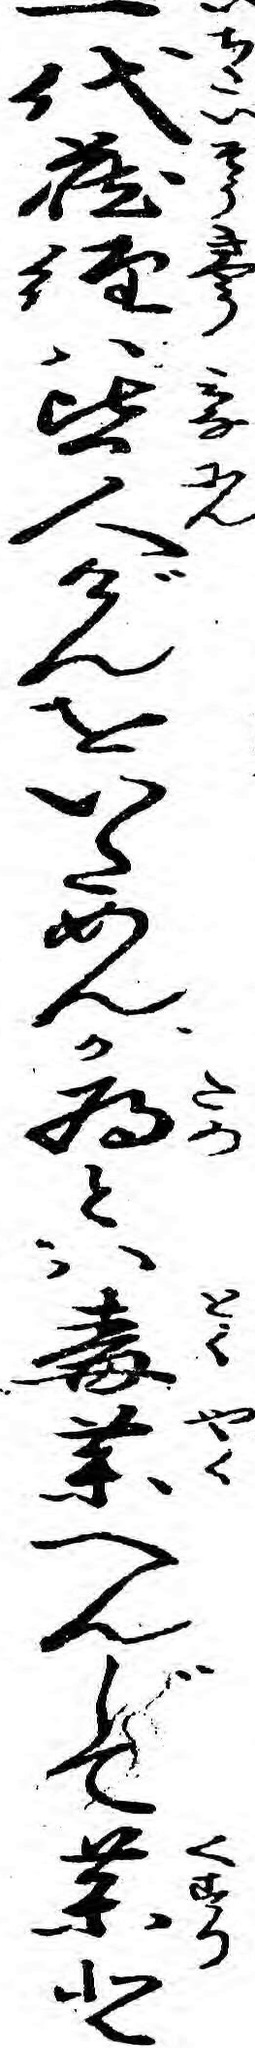一代蔵経は皆人げんをいためんが為とは毒薬へんじて薬と
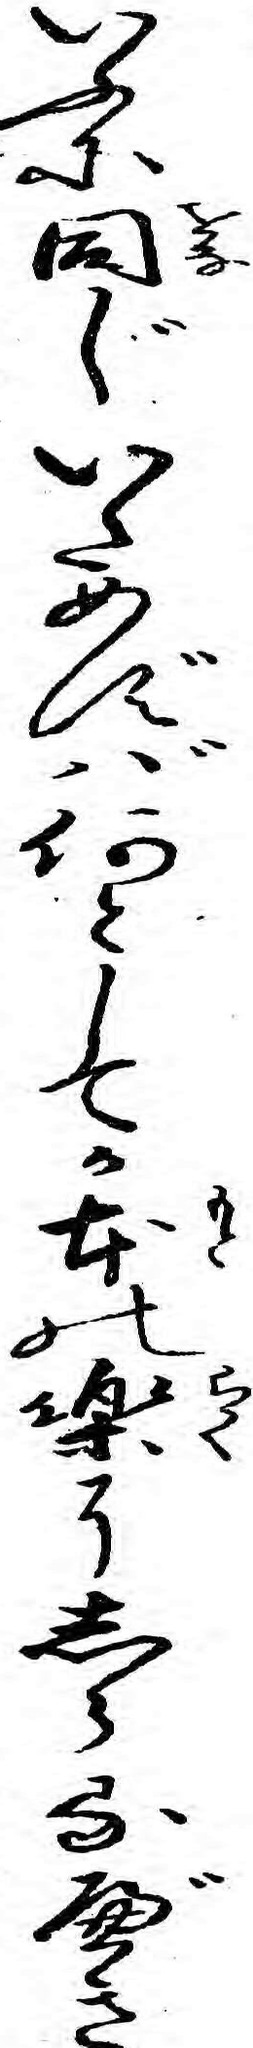いふに同じいためずば何としてか本の楽にしらるべき
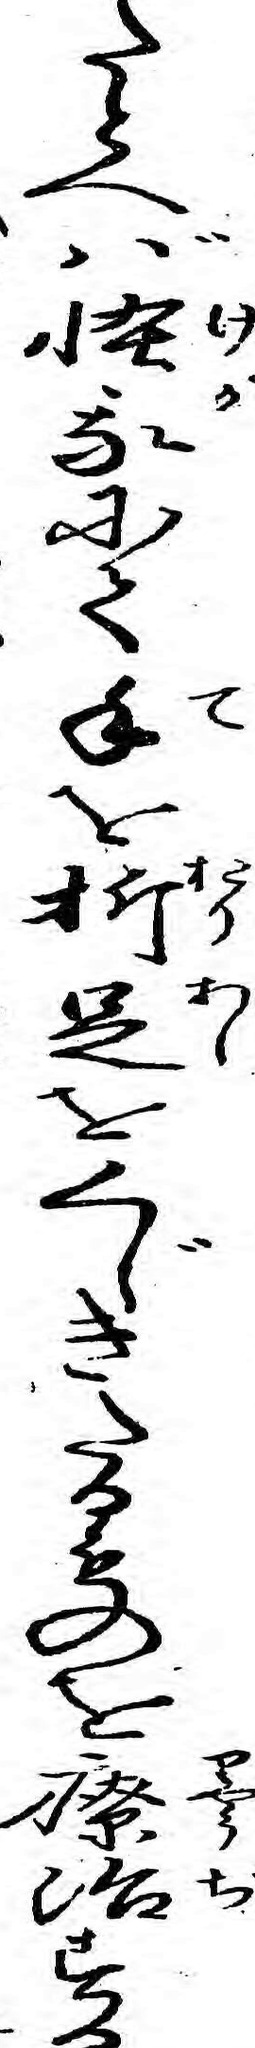たとへば怪我にて手を折足をくじきたるものを療治する
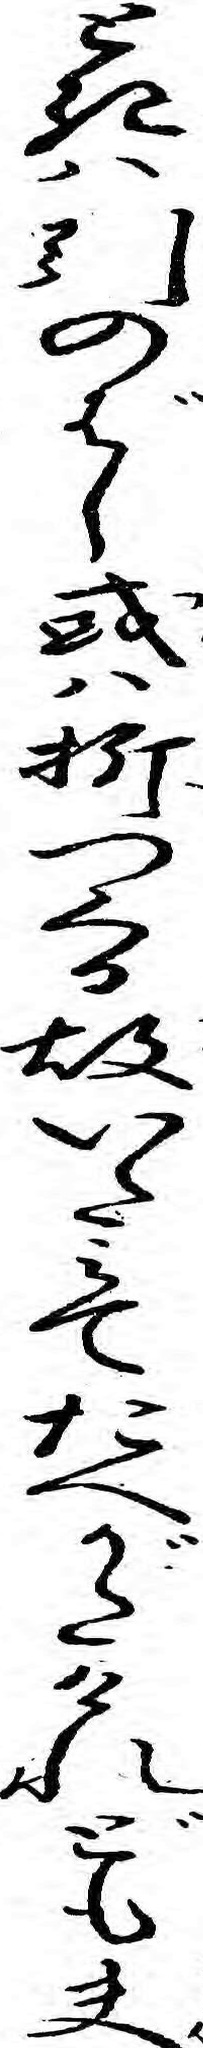ときは引のばし或は折つくる故いたみてたへがたけれども夫
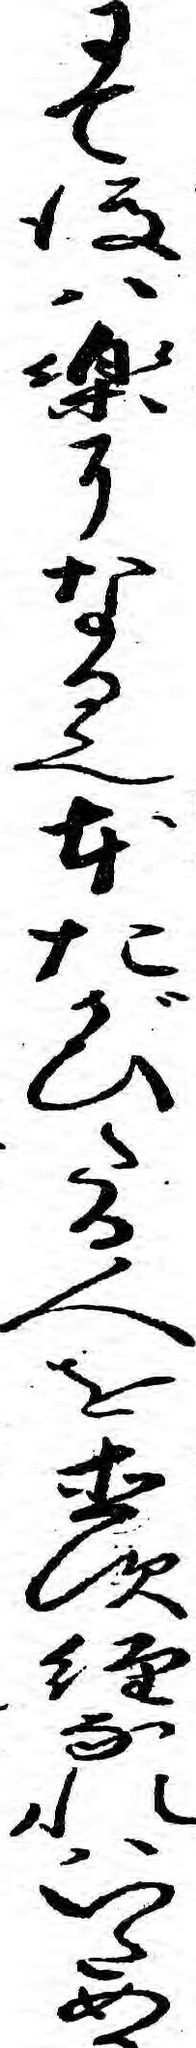にて後は楽になる也本たがひたる人を直す経なればいためる
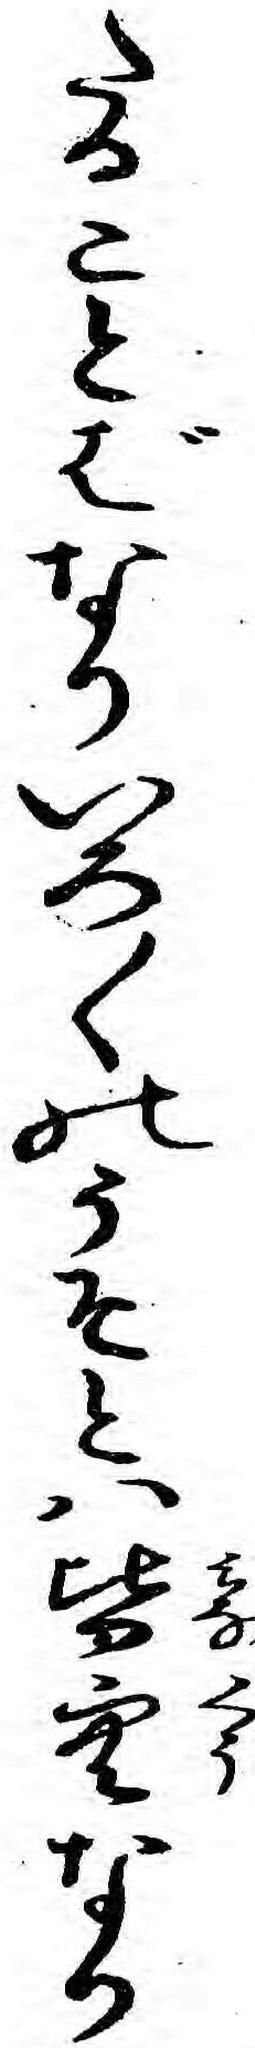たることばなりいろ〳〵のうそとは皆空なり
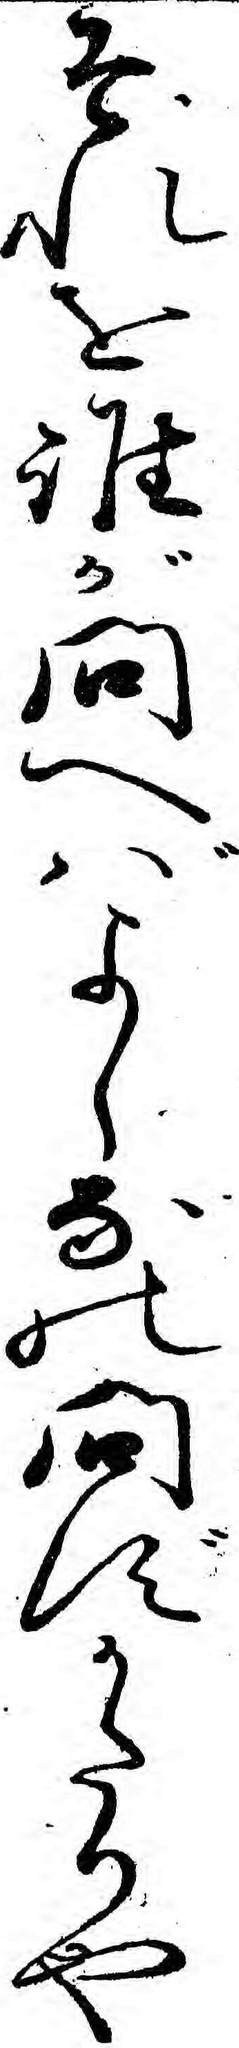それを誰が問へばよしなの問ずかたりや
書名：目なし用心抄
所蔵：国文学研究資料館
